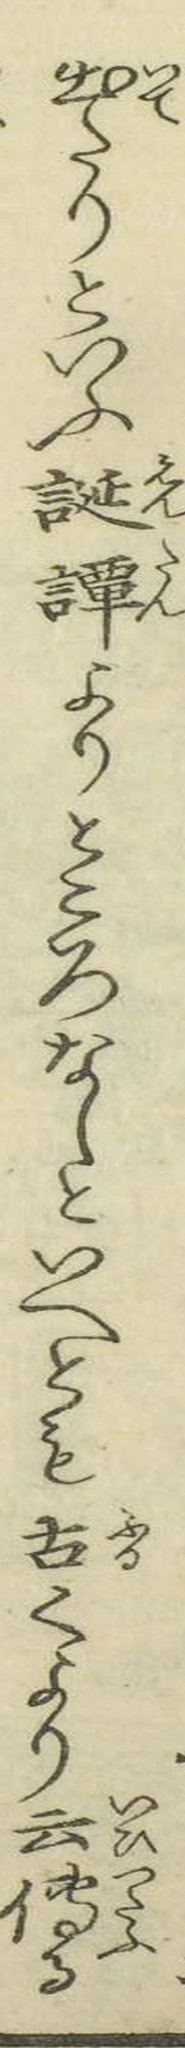出たりといふ誕譚よりところなしといへとも古くより云傳る
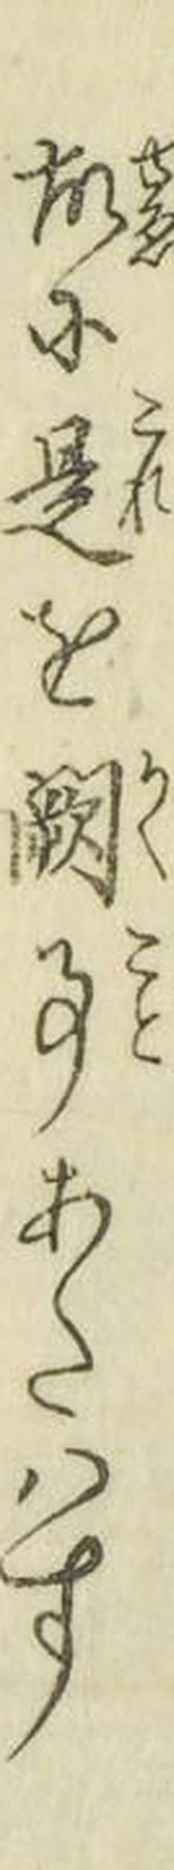故に是を闕事あたはす
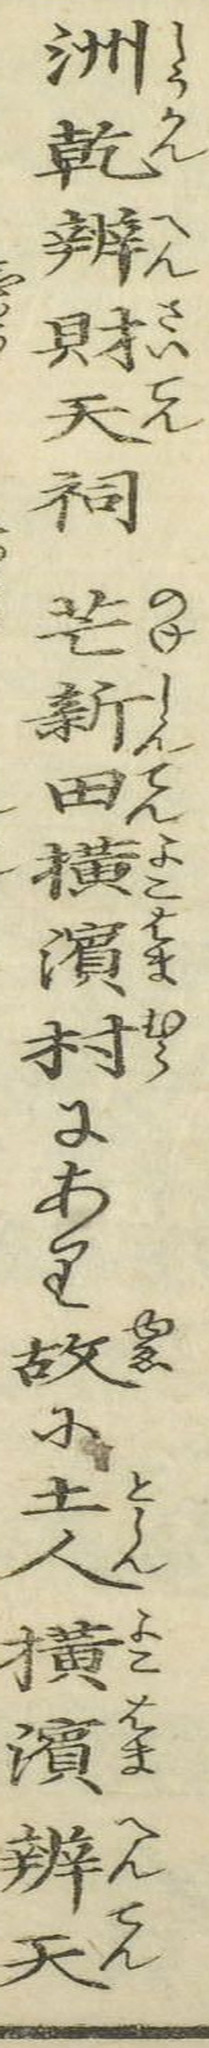洲乾辨財天祠芒新田横濱村にあり故に土人横濱辨天
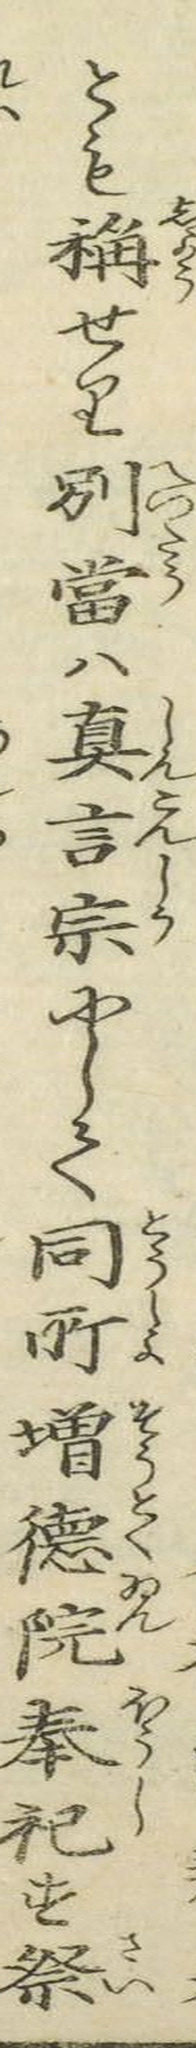とも稱せり別當は真言宗にして同所増德院奉祀す祭
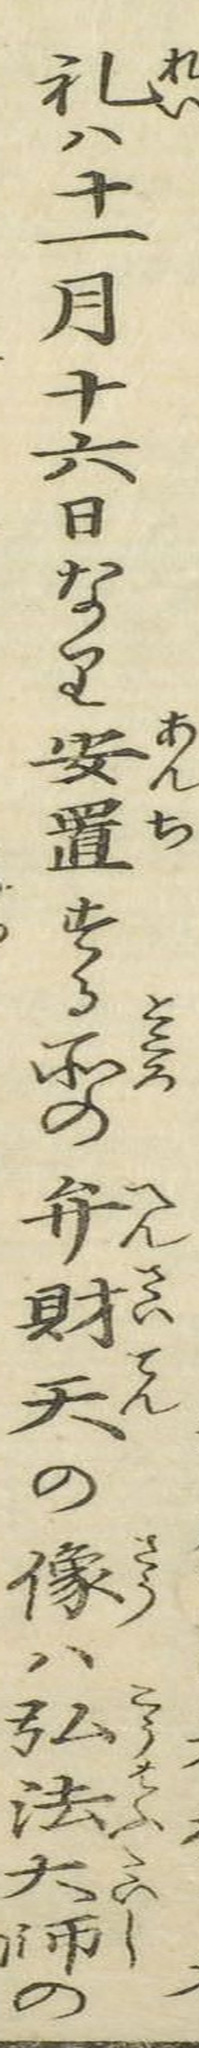礼は十一月十六日なり安置する所の弁財天の像は弘法大師の
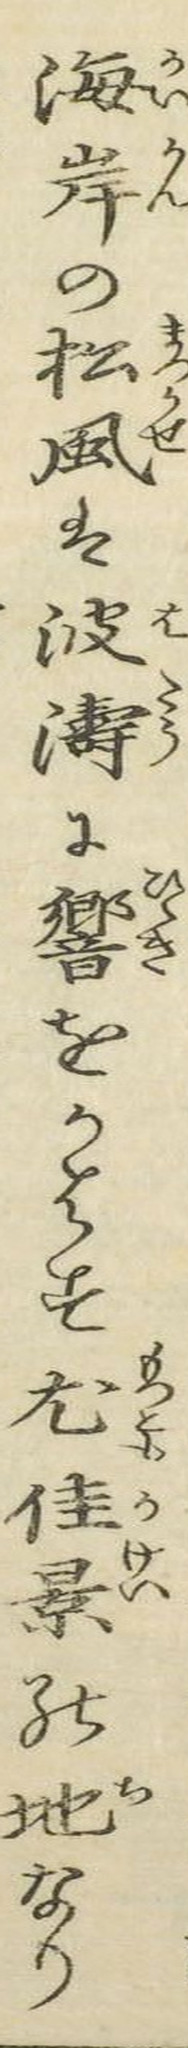海岸の松風は波濤に響をかはす尤佳景の地なり
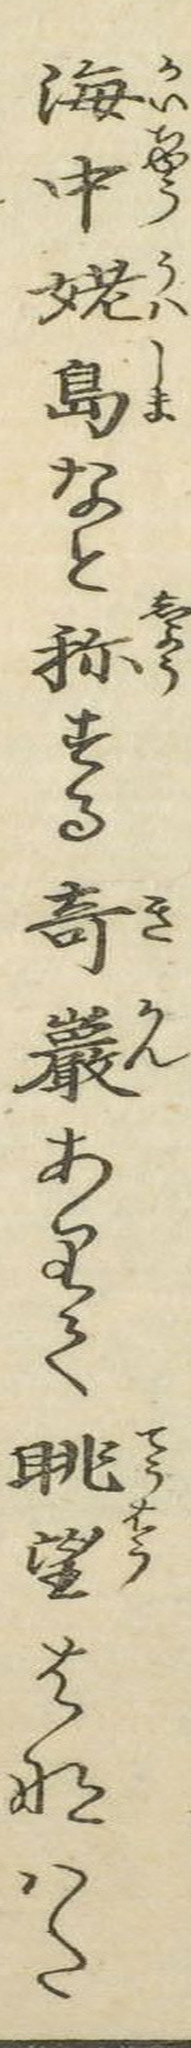海中姥島なと称する奇巌ありて眺望はなはた
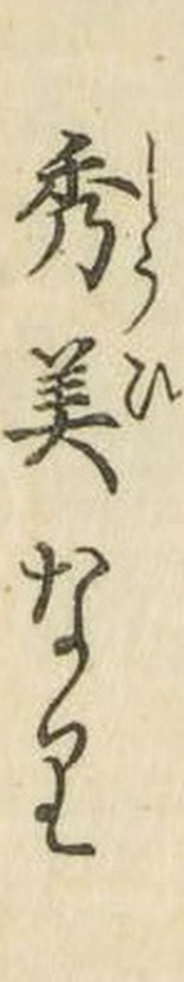秀美なり
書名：江戸名所図会 20巻 巻之5
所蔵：東京学芸大学教育コンテンツアーカイブ
